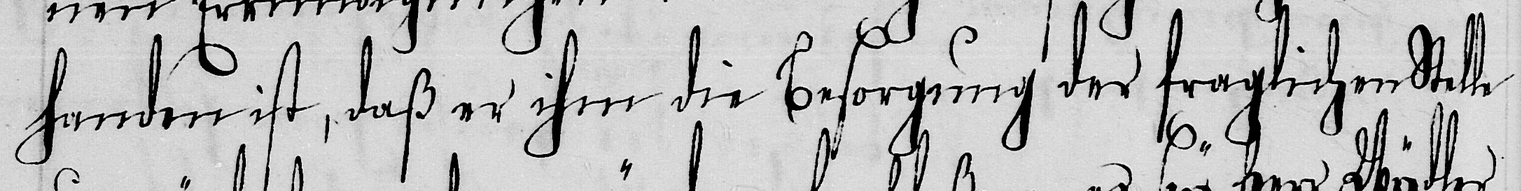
handen ist, daß er ihm die Besorgung der fraglichen Stel¬
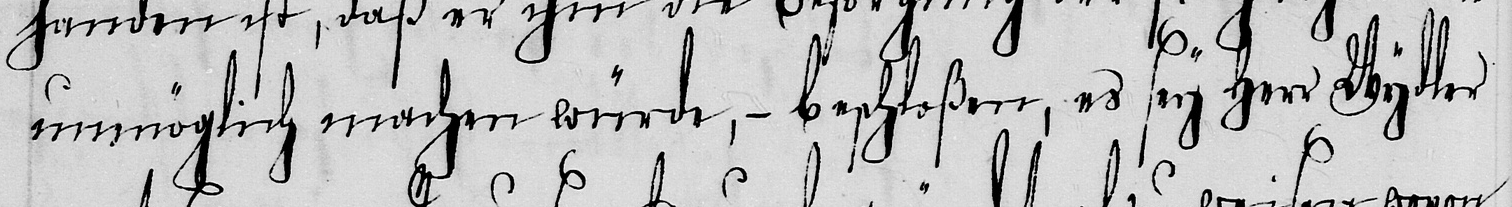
unmöglich machen würde, – beschloßen, es sey Herr Wydler
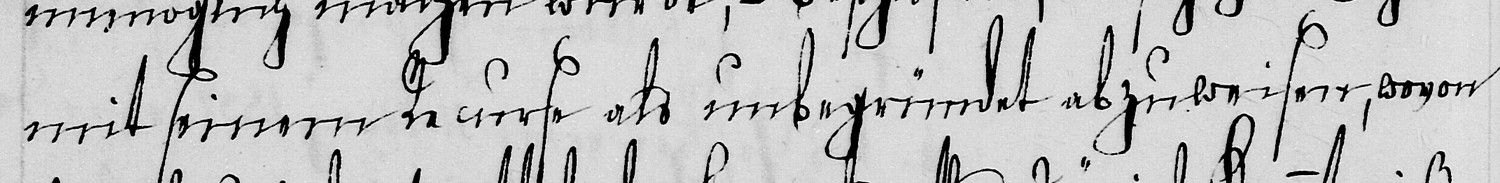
mit seinem Recurse als unbegründet abzuweisen, wovon
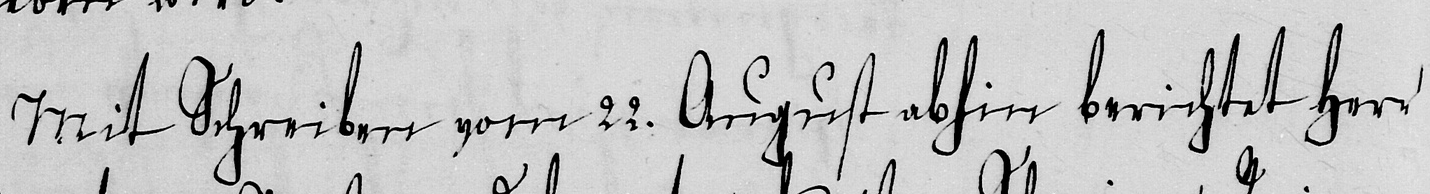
Mit Schreiben vom 22. August abhin berichtet Herr
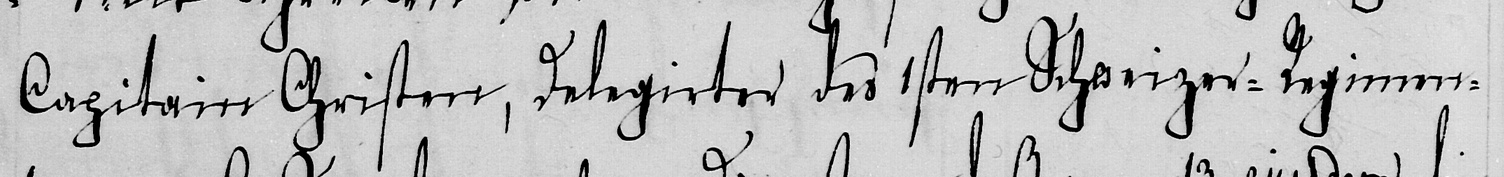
Capitain Christen, Delegirter des 1sten Schweizer-Regimen¬
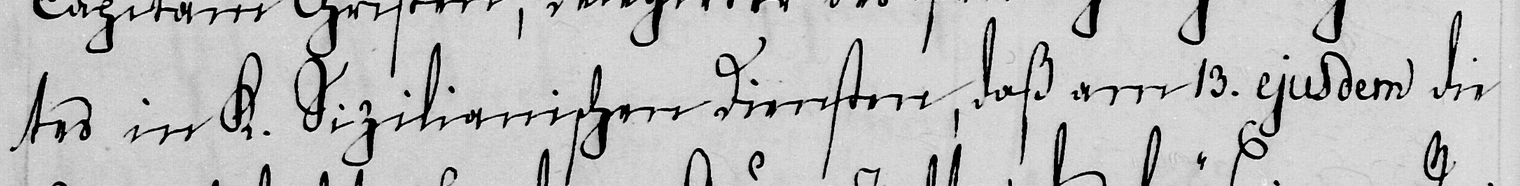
tes in K. Sizilianischen Diensten, daß am 13. ejusdem die
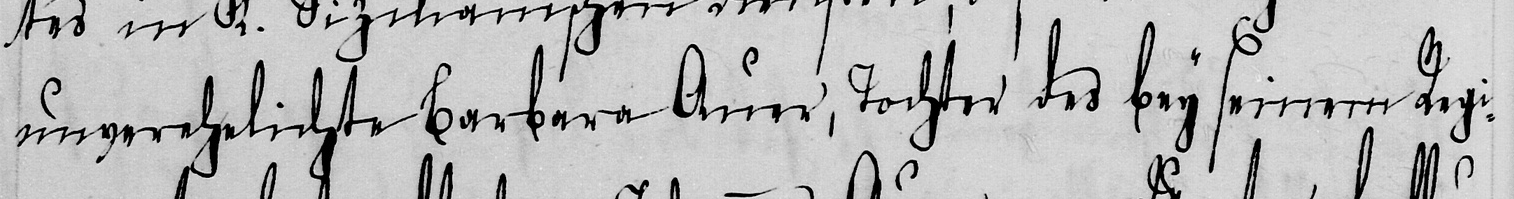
unverehelichte Barbara Auer, Tochter des bey seinem Regi¬
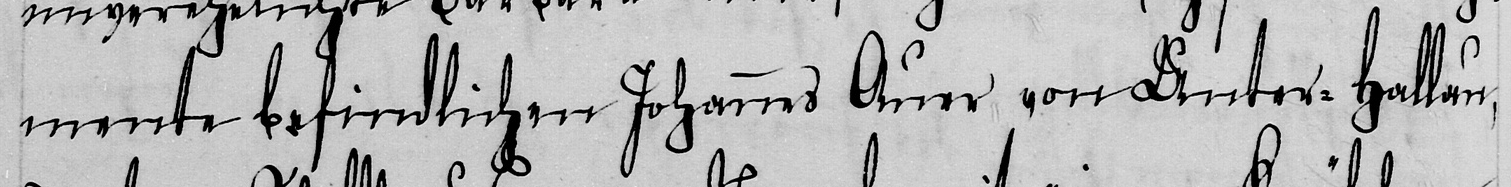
mente befindlichen Johannes Auer von Unter-Hallau,
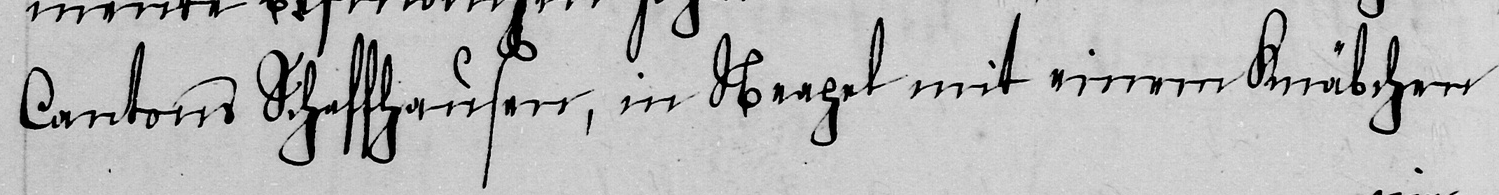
Cantons Schaffhausen, in Neapel mit einem Knäbchen
